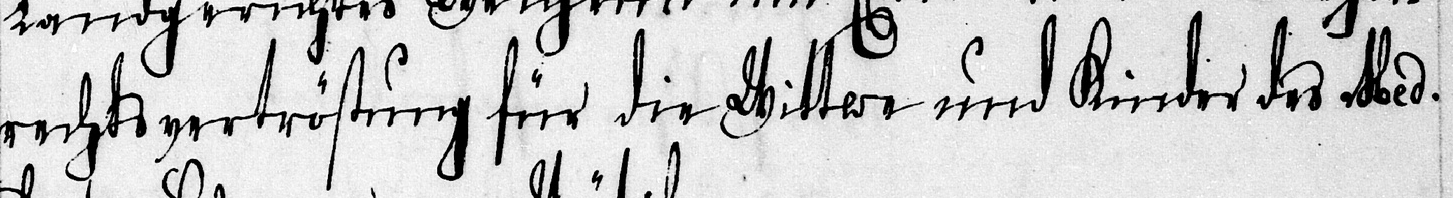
rechtsvertröstung für die Wittwe und Kinder des Med.
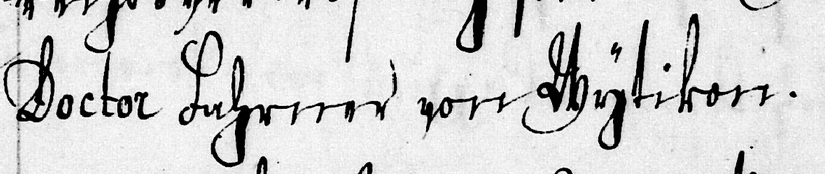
Doctor Fahrner von Wytikon.
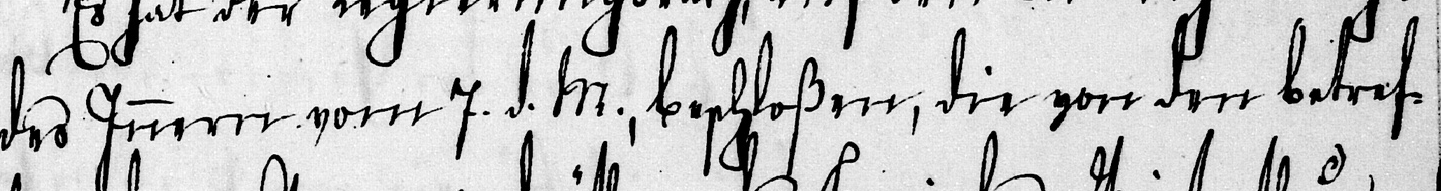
des Innern vom 7. d. M., beschloßen, die von den betref¬
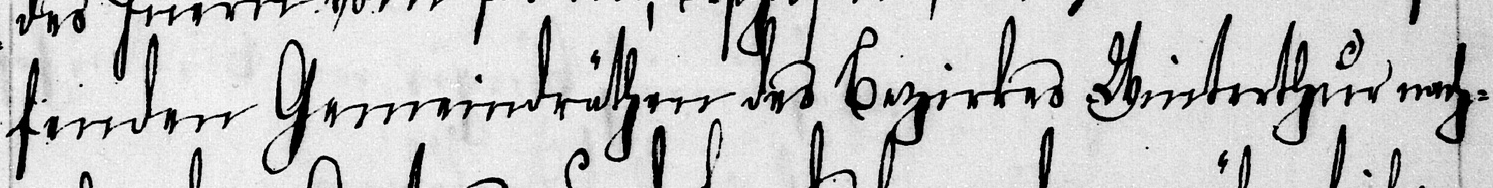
fenden Gemeindräthen des Bezirkes Winterthur nach¬
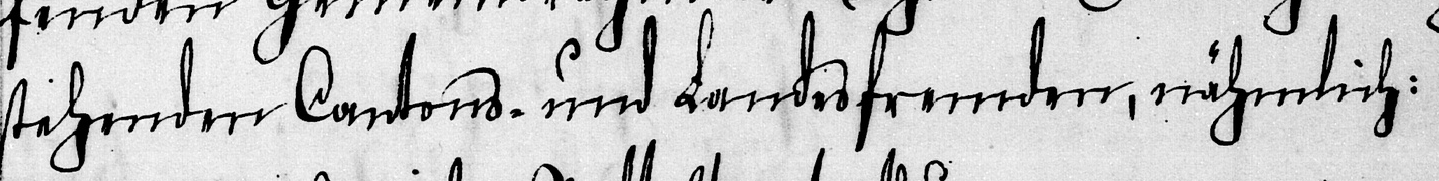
stehenden Cantons- und Landesfremden, nähmlich:
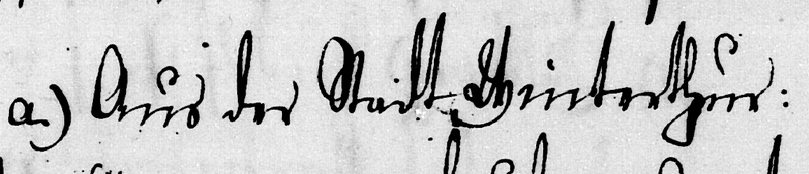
a.) Aus der Stadt Winterthur:
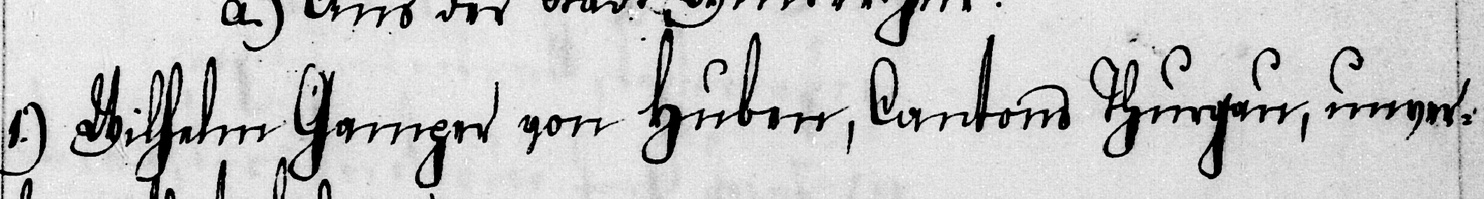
1.) Wilhelm Gamger von Huben, Cantons Thurgau, unver¬
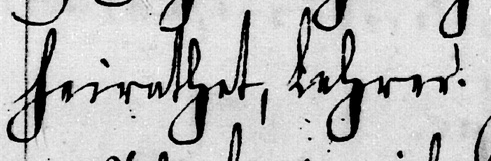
heirathet, Lehrer.
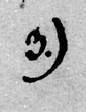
d.)
